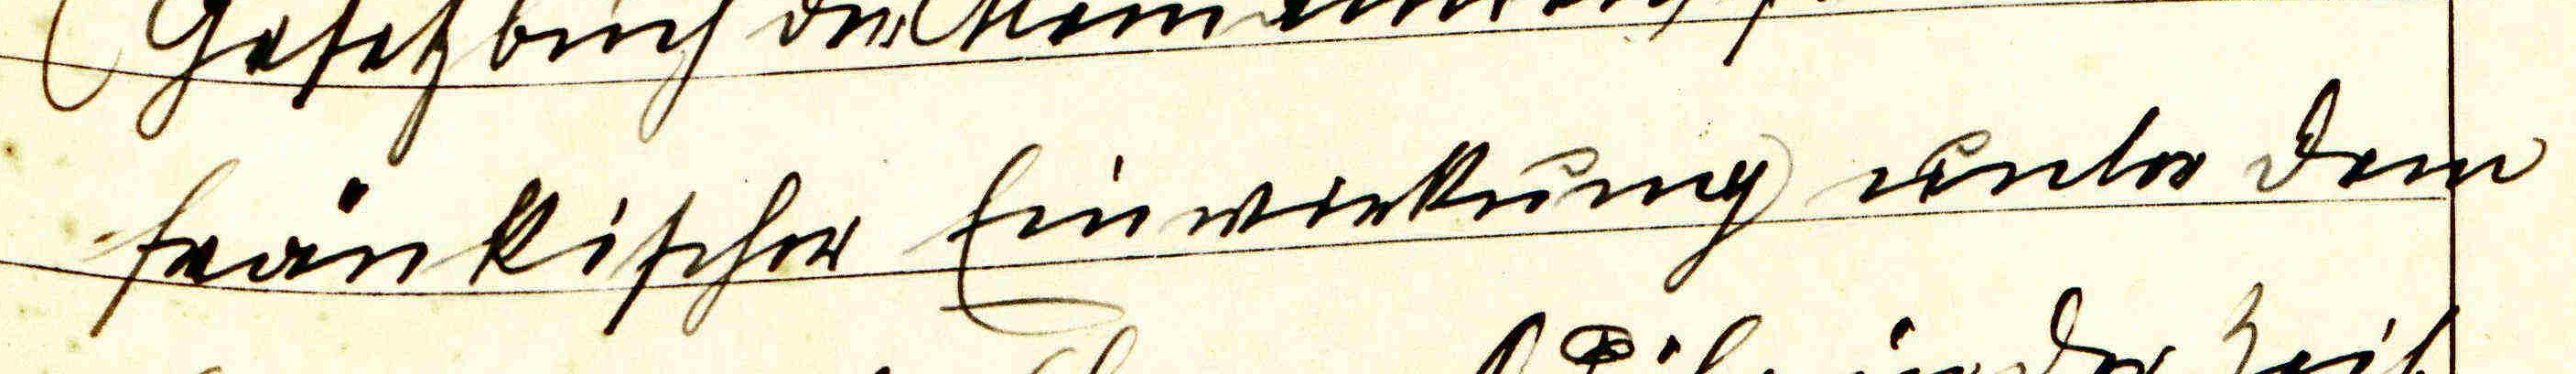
fränkischer Einwirkung unter dem
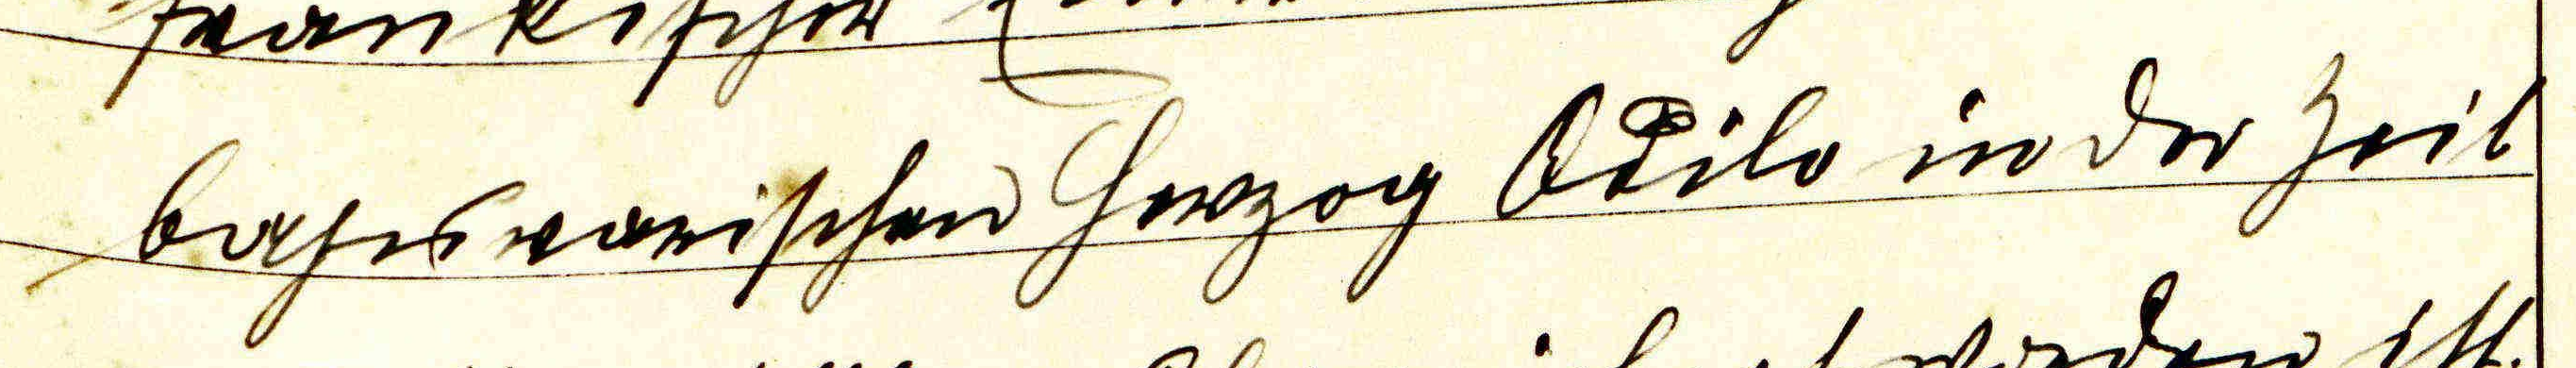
bajuwarischen Herzog Odilo in der Zeit
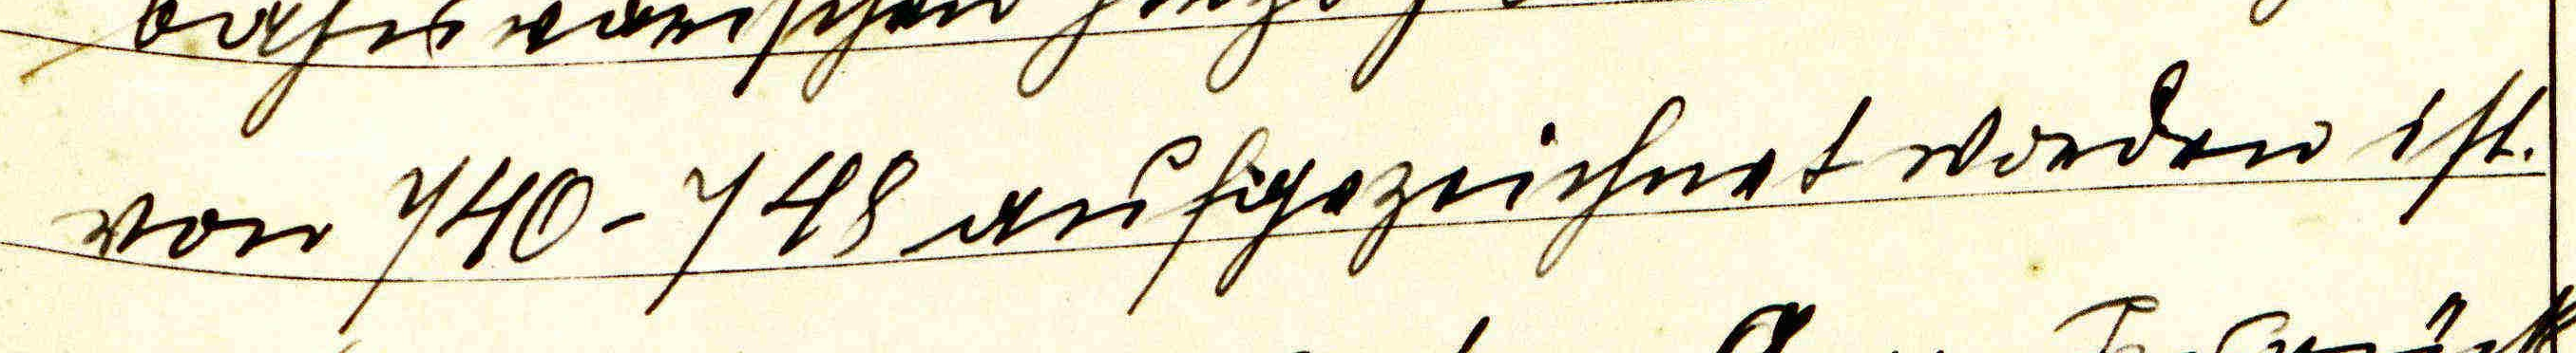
von 740 – 748 aufgezeichnet worden ist.
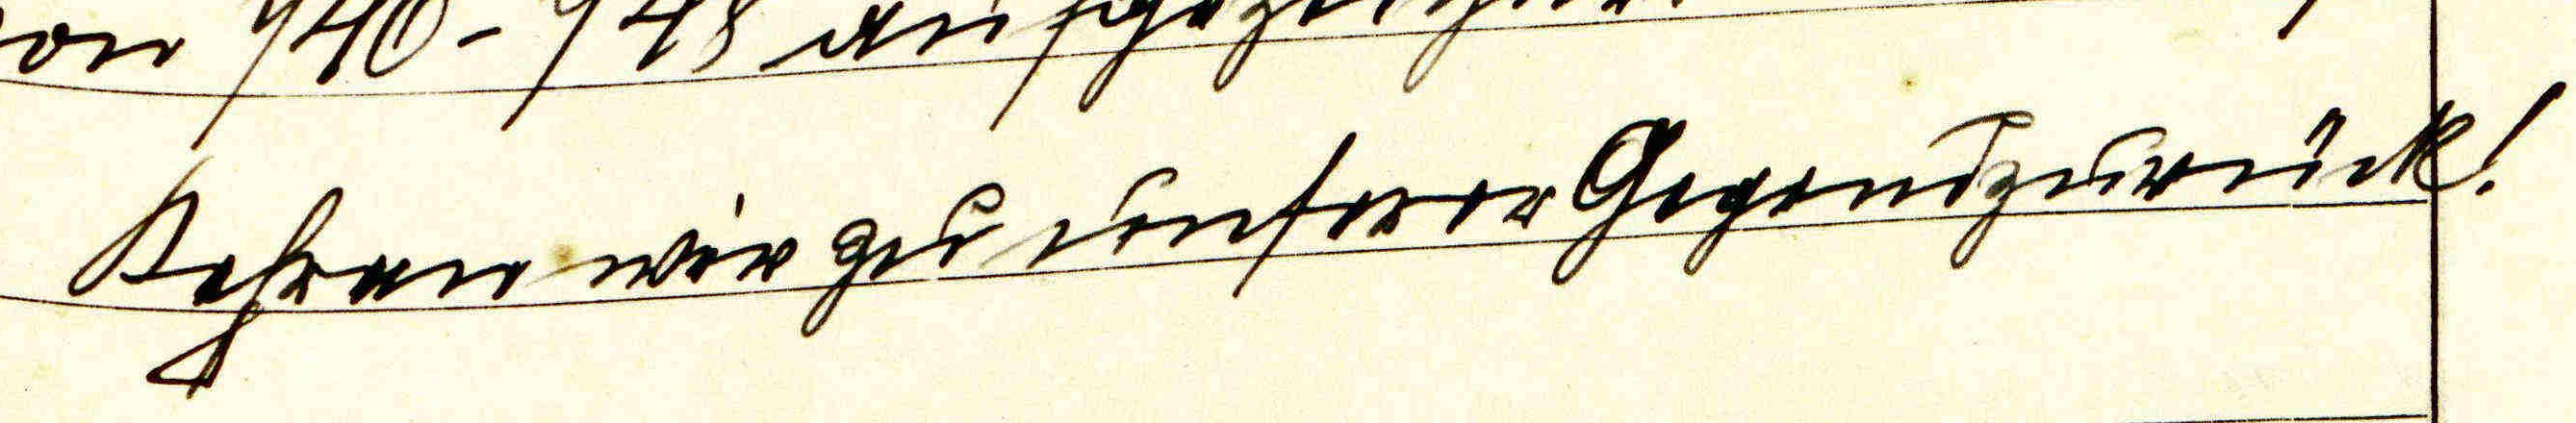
Kehren wir zu unserer Gegend zurück.
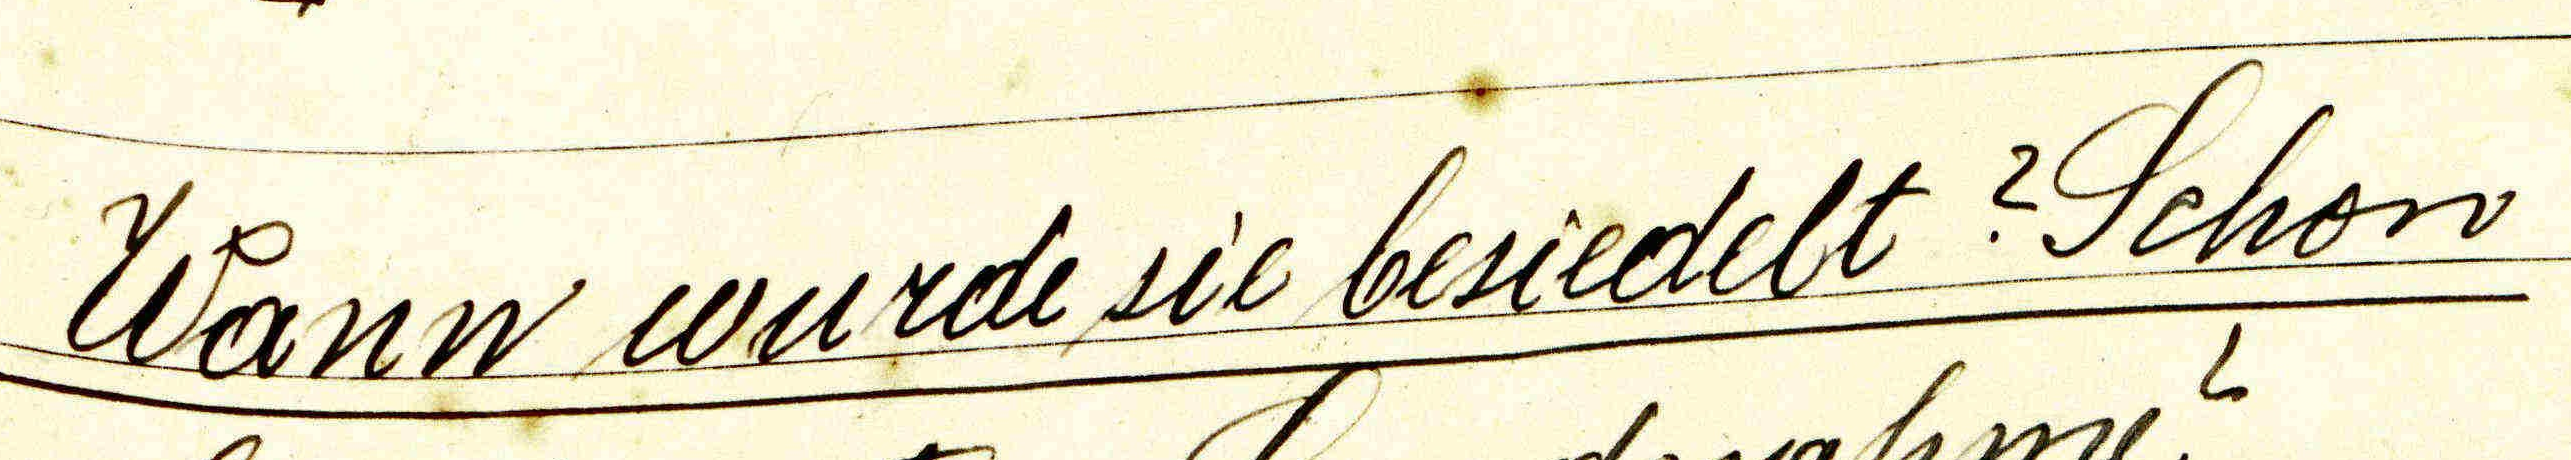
Wann Wurde sie besiedelt? Schon
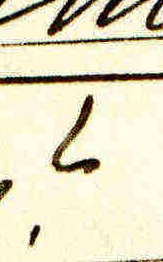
?
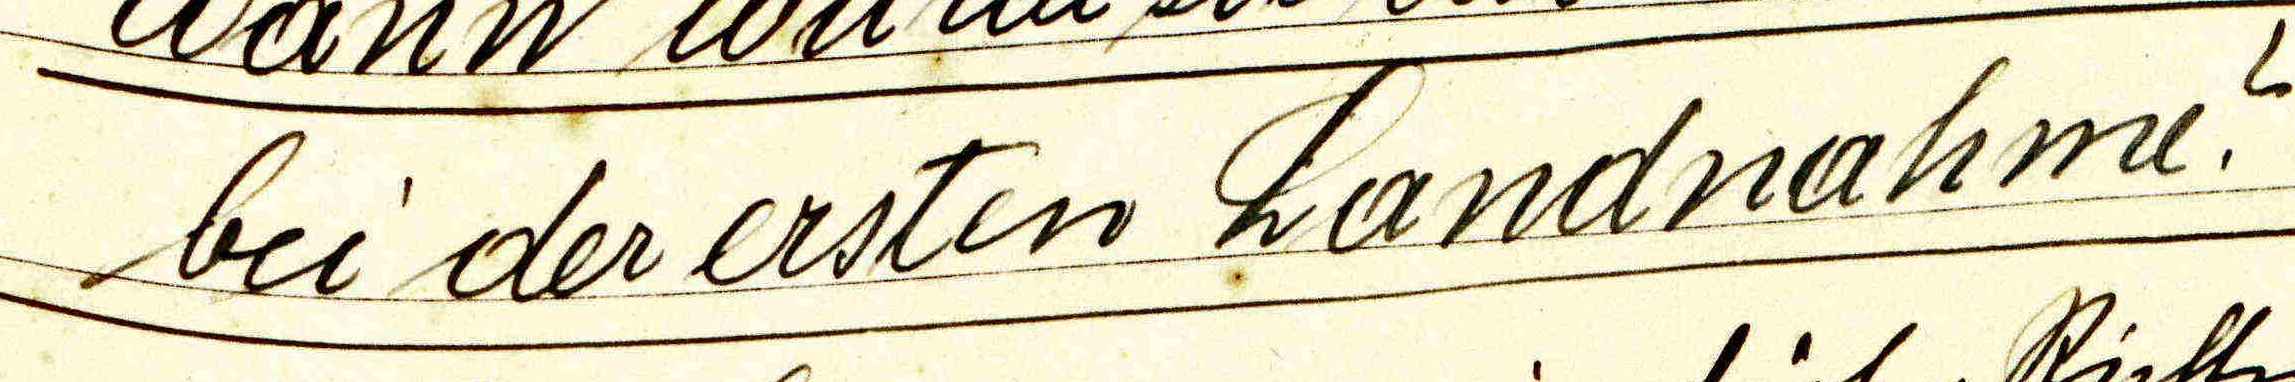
bei der ersten Landnahme
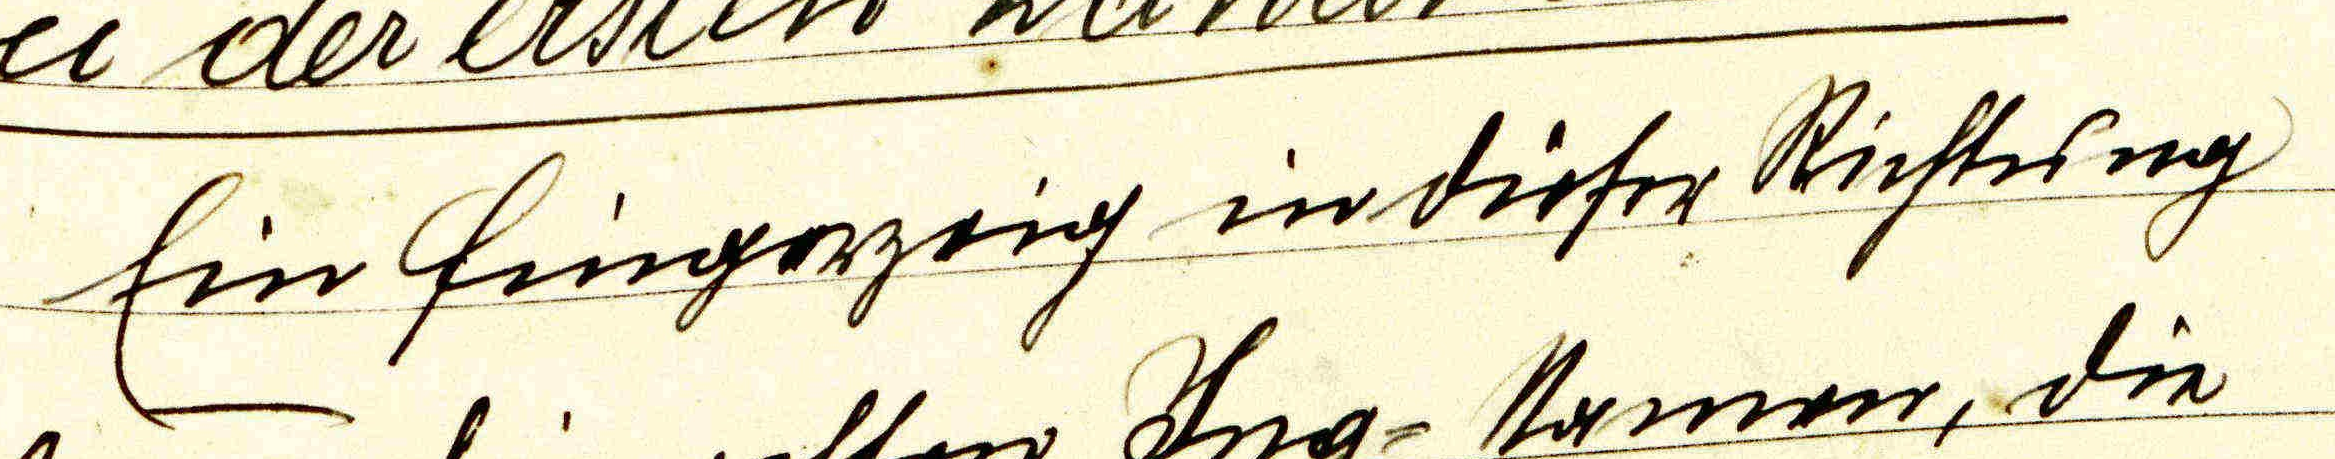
Ein Fingerzeig in dieser Richtung
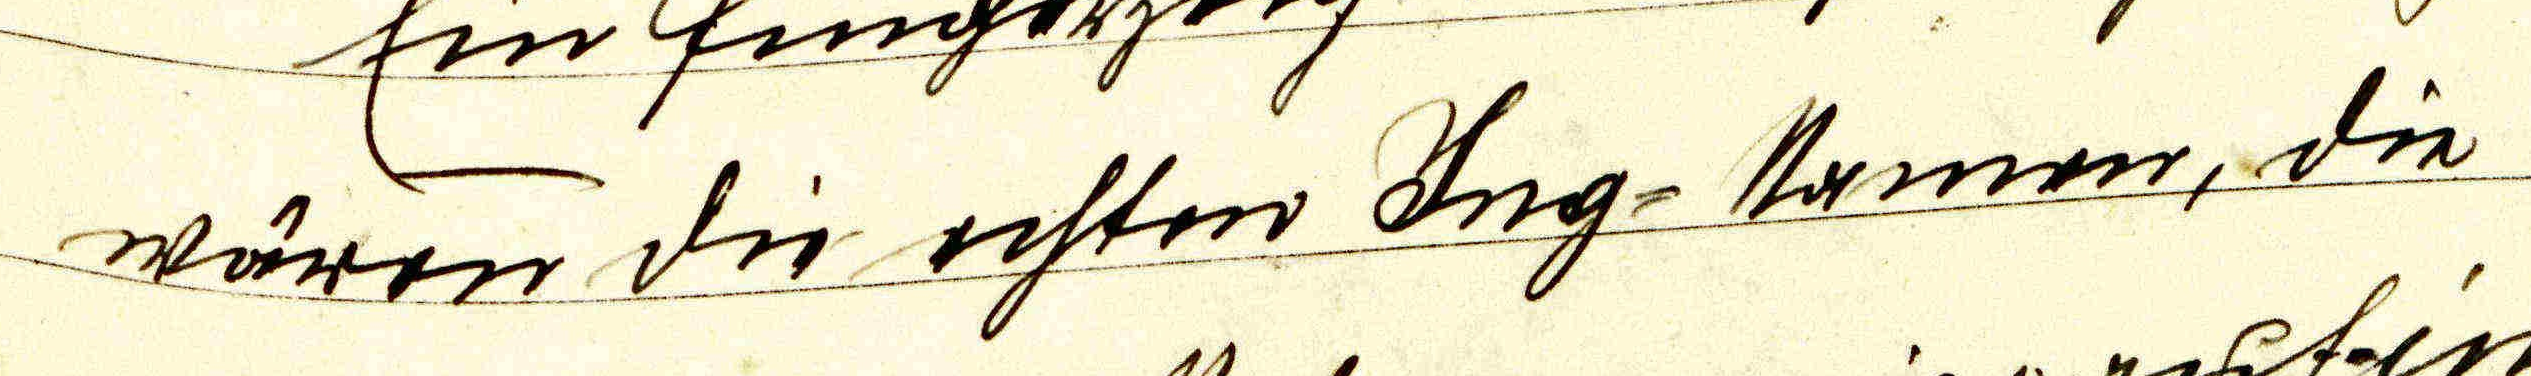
wären die echten Ing-Namen, die
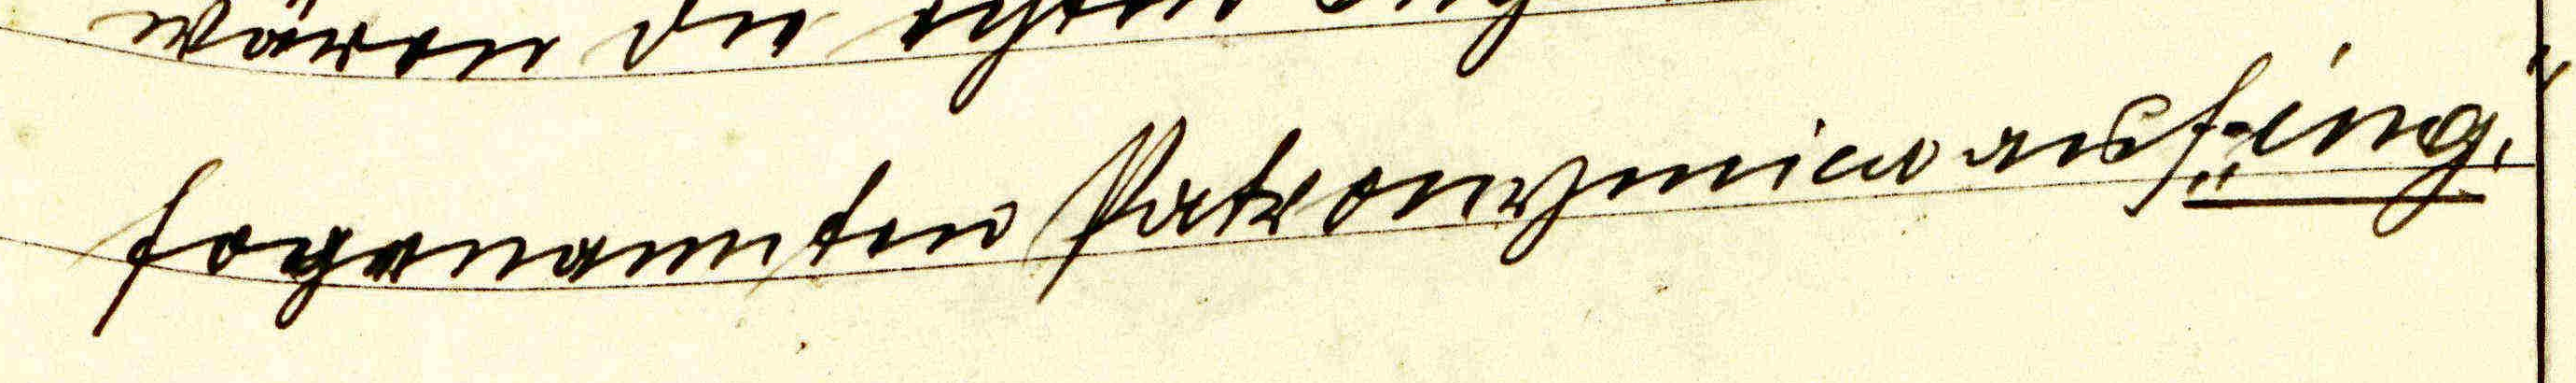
sogenannten Patronymica auf „ing“,
